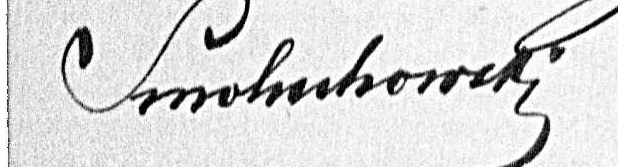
Smolnchowski
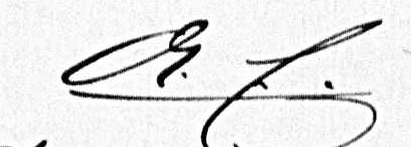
A E
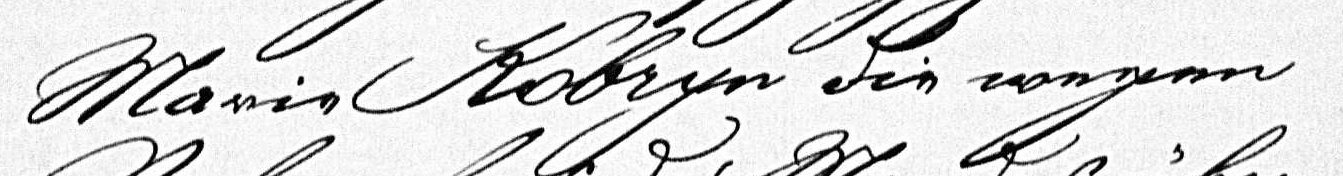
Marie Kobryn die wegen
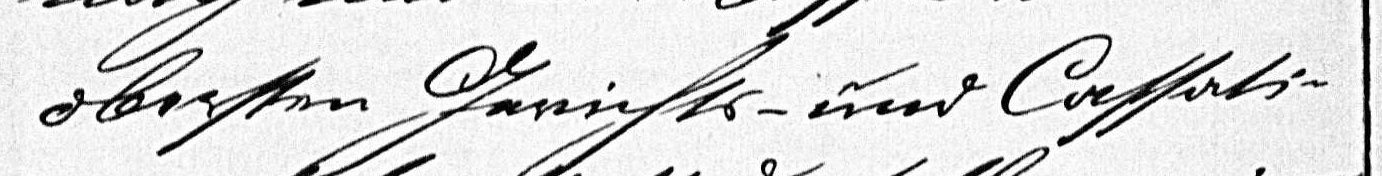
obersten Gerichts- und Cassati¬
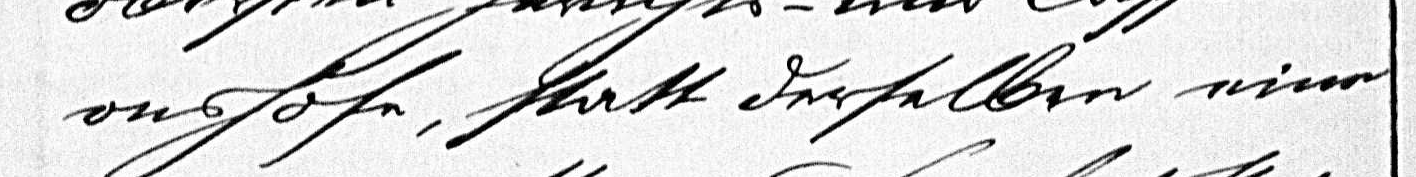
onshofe, statt derselben eine
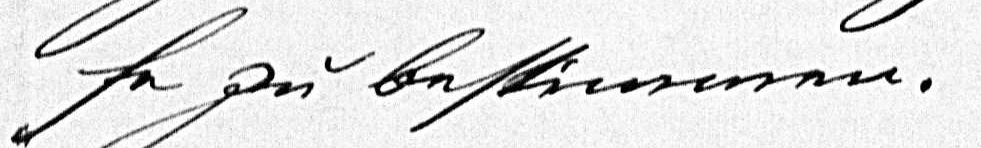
fe zu bestimmen.
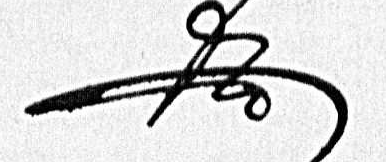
FJ
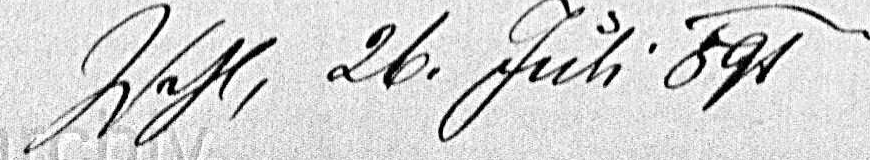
Ischl 26. Juli 1891
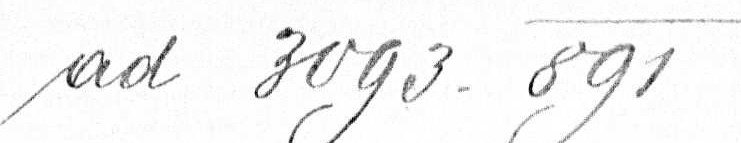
ad 3093 - 891
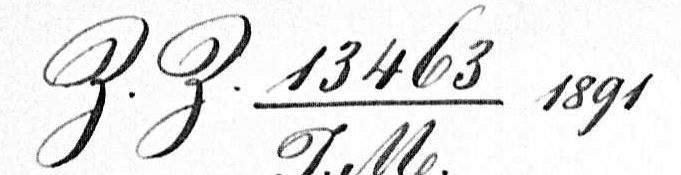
Z. Z. 13463 - 1891
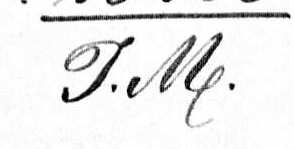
J.M.
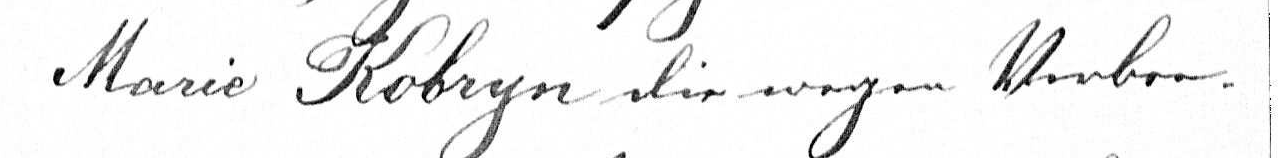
Marie Kobryn die wegen Verbre¬
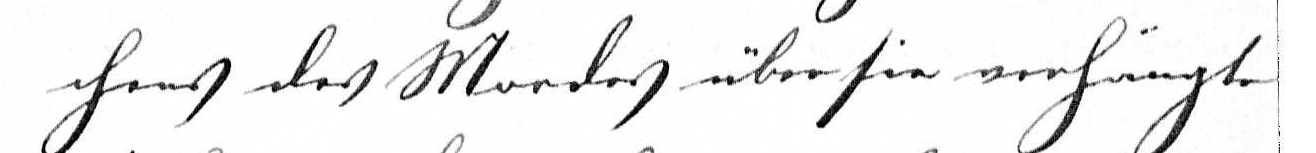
chens des Mordes über sie verhängte
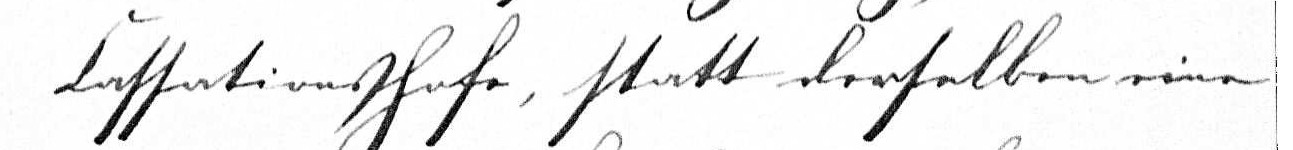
Cassationshofe, statt derselben eine
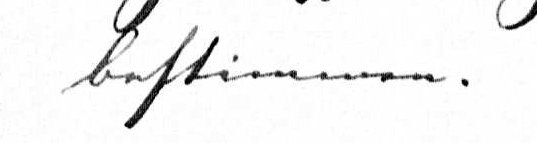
bestimmen.
